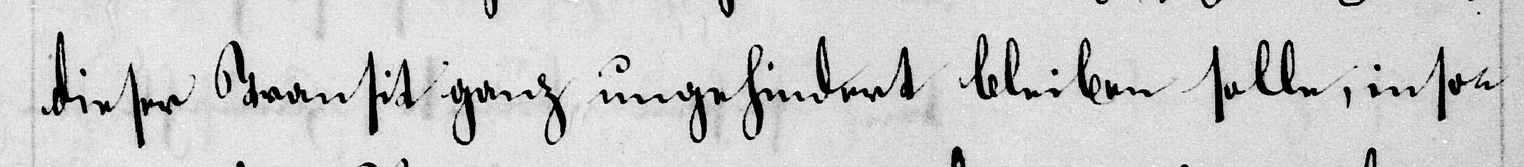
dieser Transit ganz ungehindert bleiben solle, inso¬
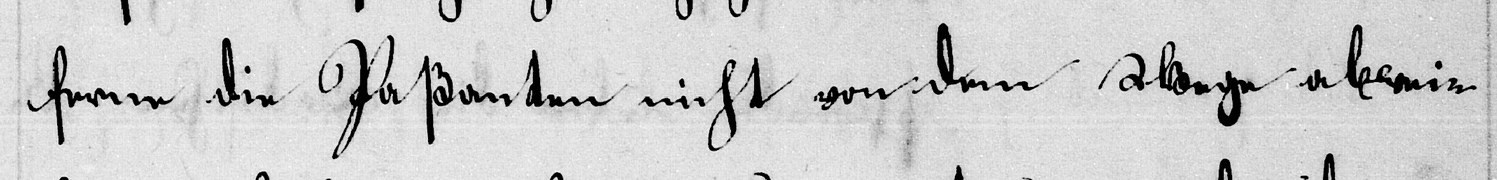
fern die Paßanten nicht von dem Wege abwei¬
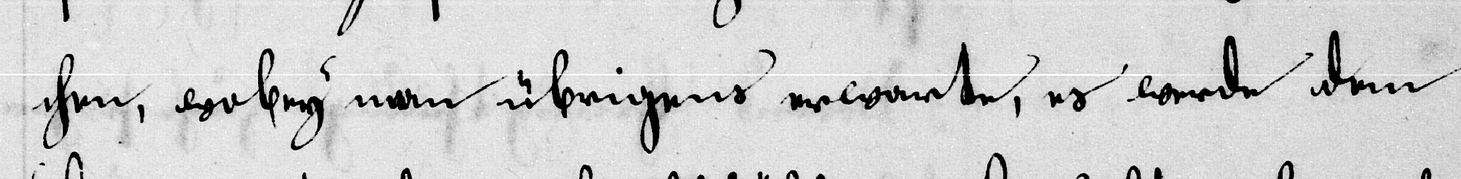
chen, wobey man übrigens erwarte, es werde dem
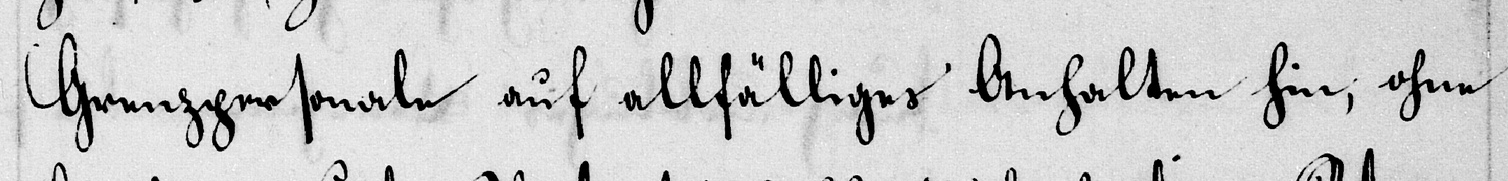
Grenzpersonale auf allfälliges Anhalten hin, ohne
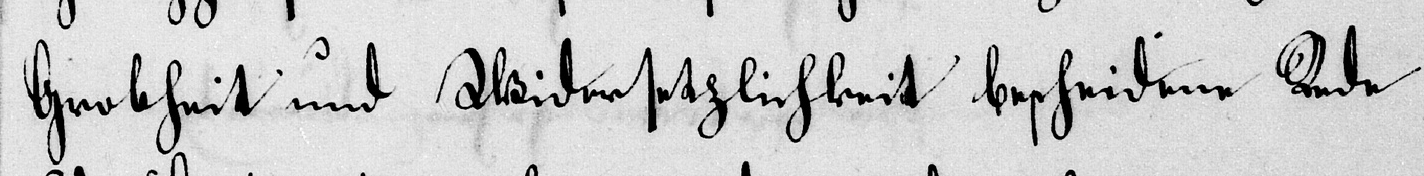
Grobheit und Widersetzlichkeit bescheiden Rede
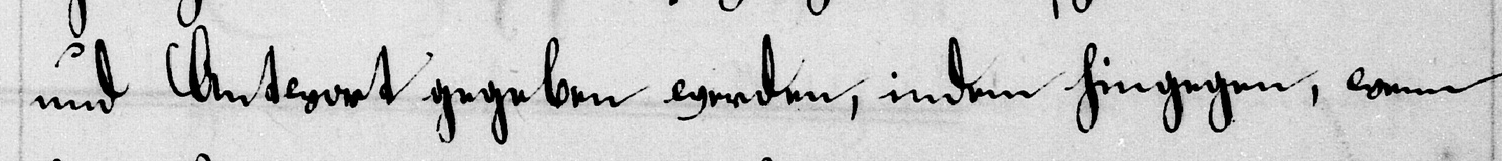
und Antwort gegeben werden, indem hingegen, wenn
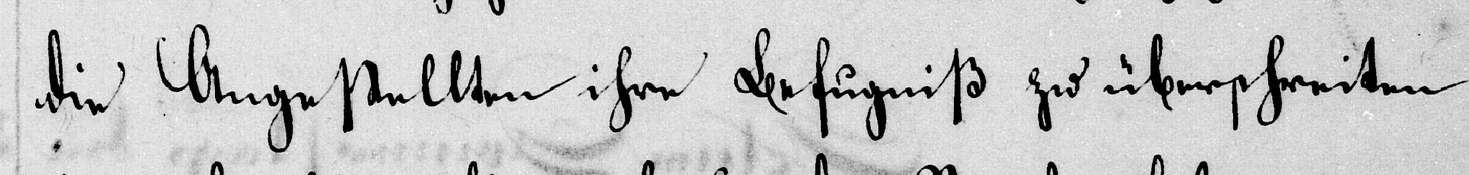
die Angestellten ihre Befugniß zu überschreiten
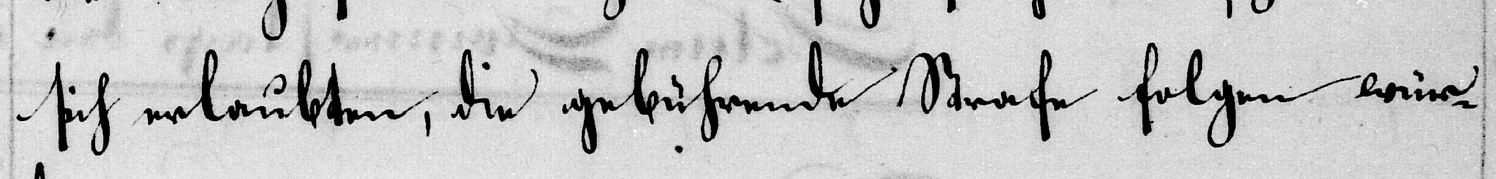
sich erlaubten, die gebührende Strafe folgen würde.
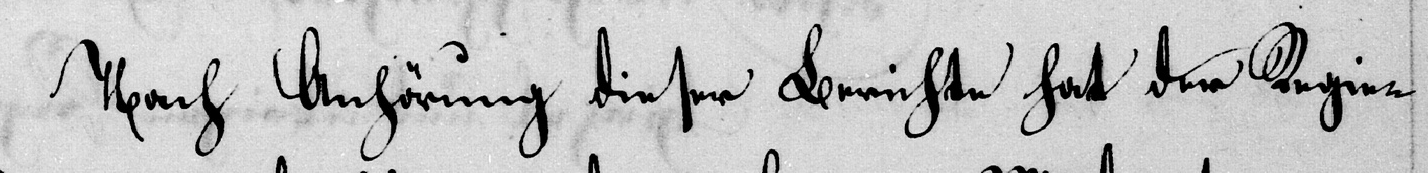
Nach Anhörung dieser Berichte hat der Regie¬
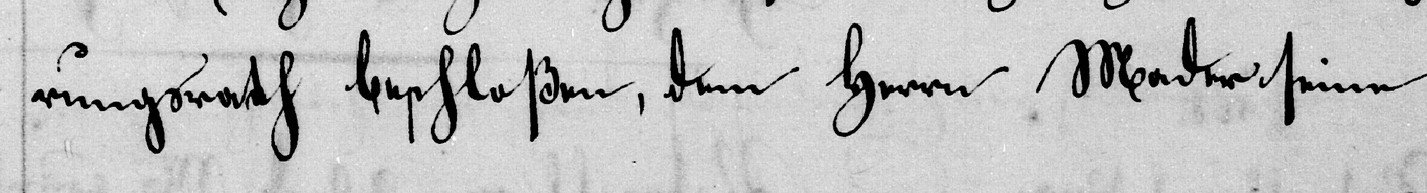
rungsrath beschloßen, dem Herrn Mader seine
